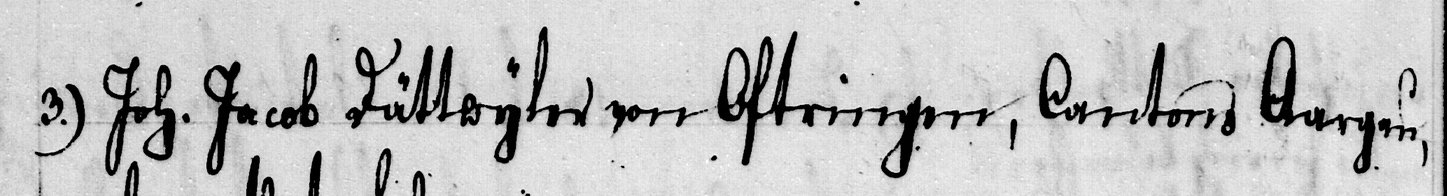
3.) Joh. Jacob Dättwyler von Oftringen, Cantons Aargau,
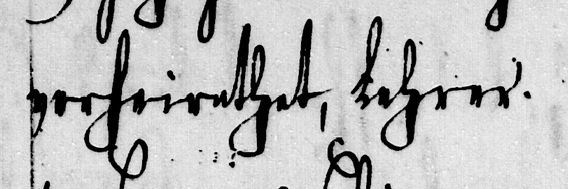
verheirathet, Lehrer.
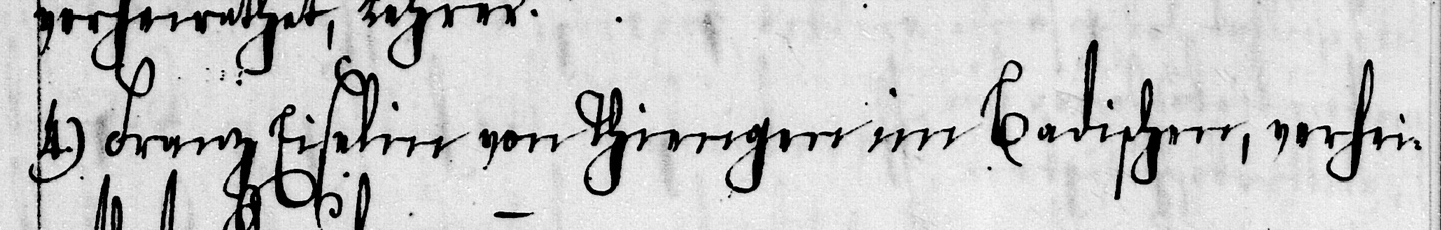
4.) Franz Eiselin von Thiengen im Badischen, verhei¬
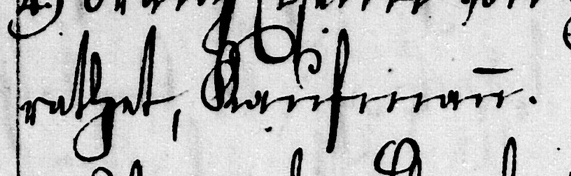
rathet, Kaufmann.
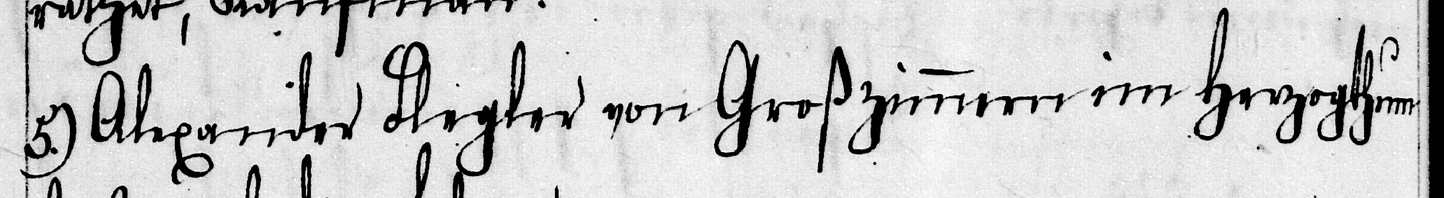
5.) Alexander Flegler von Großzimmern im Herzogthum
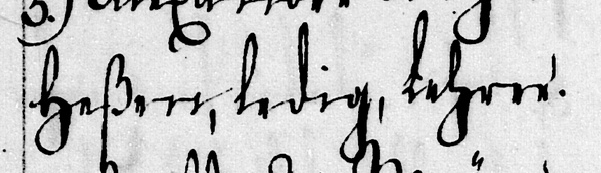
Heßen, ledig, Lehrer.
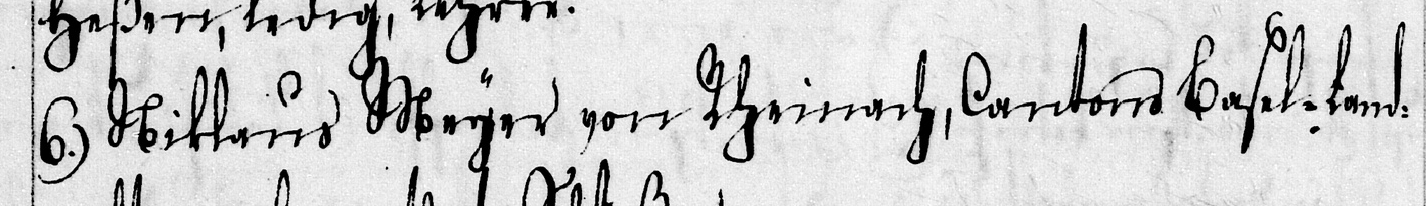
6.) Niklaus Meyer von Rheinach, Cantons Basel-Lan¬
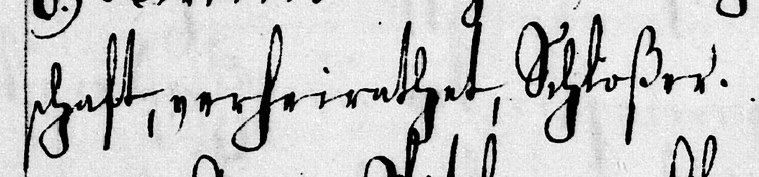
schaft, verheirathet, Schloßer.
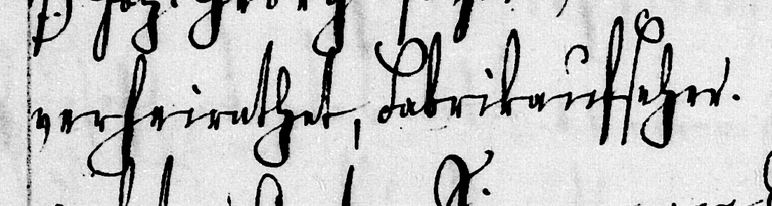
verheirathet, Fabrikaufseher.
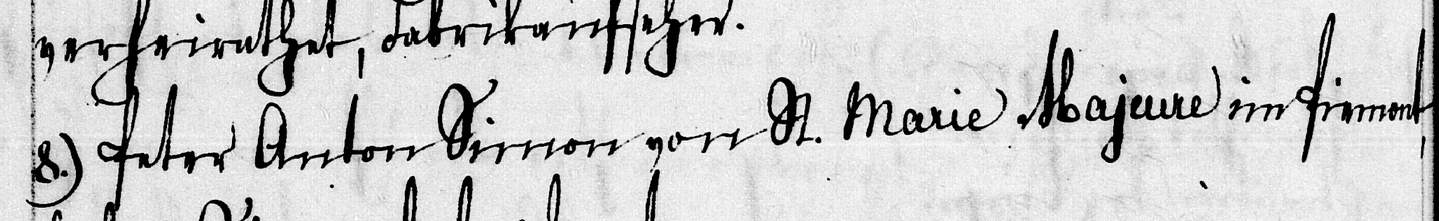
8.) Peter Anton Simon von St. Marie Majeure im Piemont,
